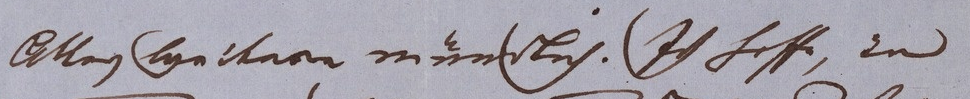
Alles weitere mündlich. Ich hoffe, in
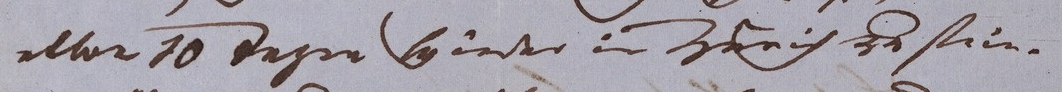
etwa 10 Tagen wieder in Zürich zu sein.
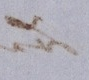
Aug.
